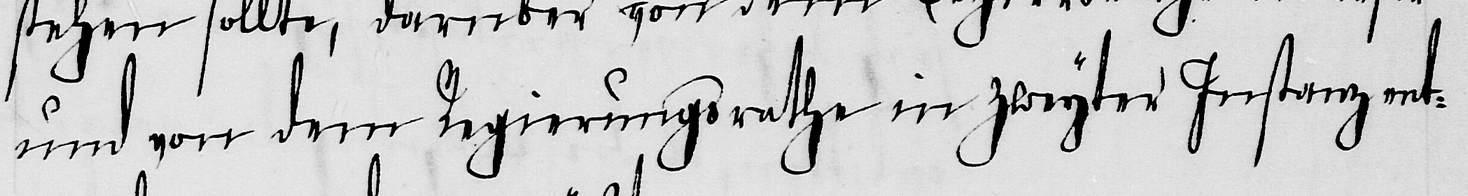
und von dem Regierungsrathe in zweyter Instanz ent¬
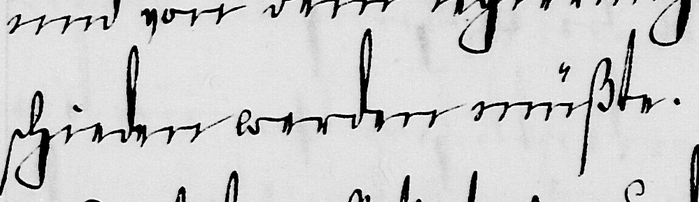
schieden werden müßte.
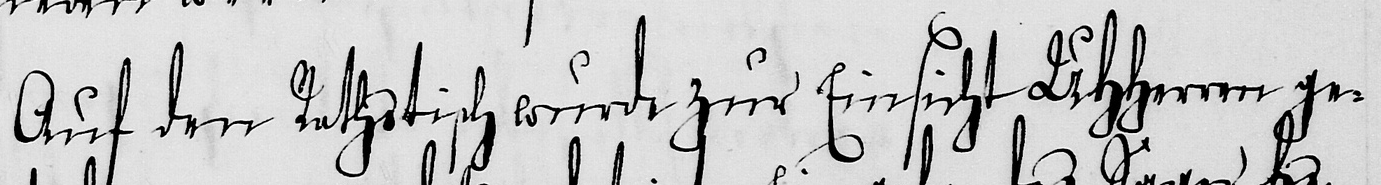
Auf den Rathstisch wurde zur Einsicht UHHerren ge¬
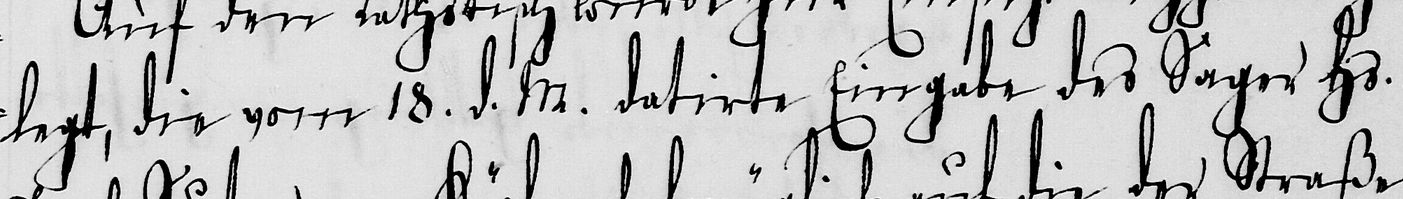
legt, die vom 18. d. M. datirte Eingabe des Sager Hs.
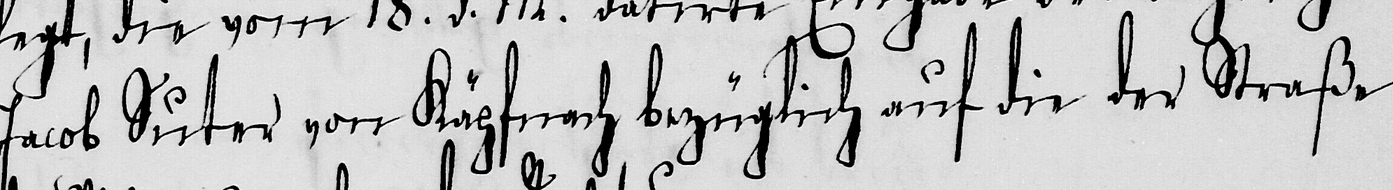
acob Suter von Käpfnach bezüglich auf die der Straße
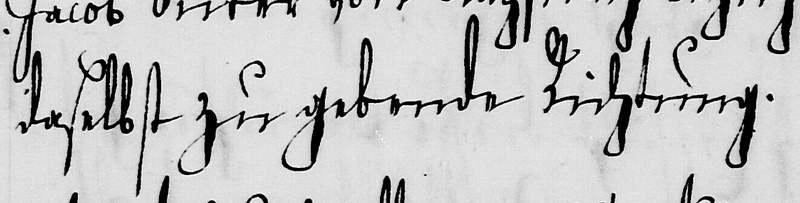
daselbst zu gebende Richtung.
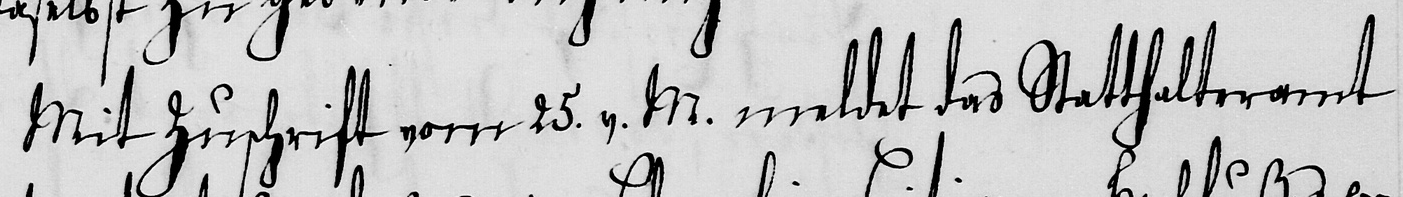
Mit Zuschrift vom 25. v. M. meldet das Statthalteramt
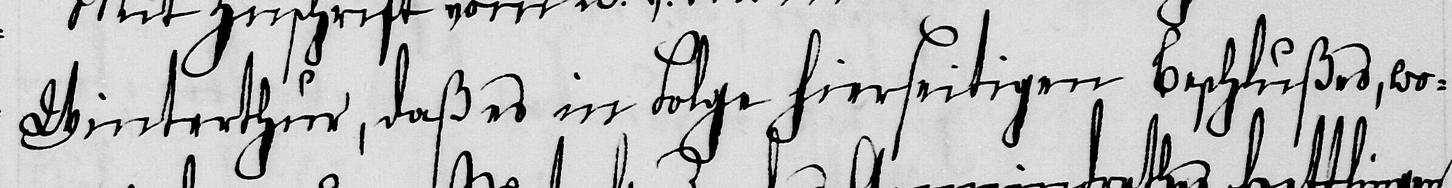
Winterthur, daß es in Folge hierseitigen Beschlußes, wo¬
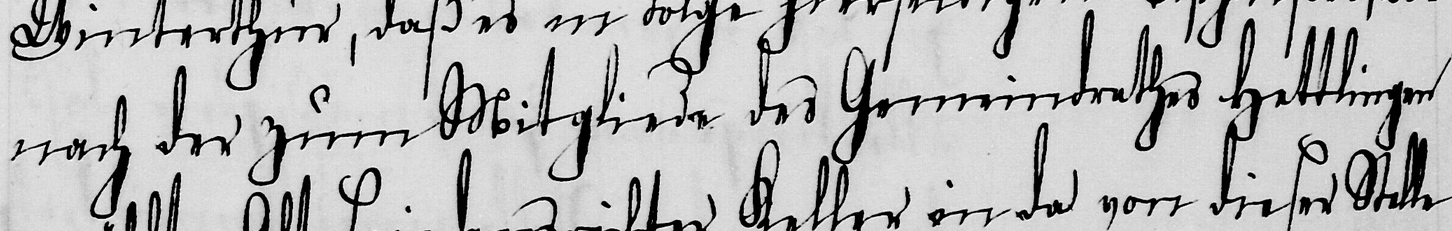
nach der zum Mitgliede des Gemeindrathes Hettlingen
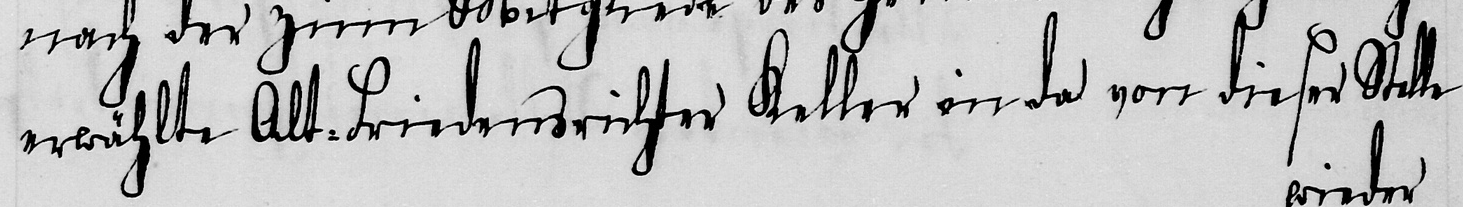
erwählte Alt-Friedensrichter Keller in da von dieser Stel¬
